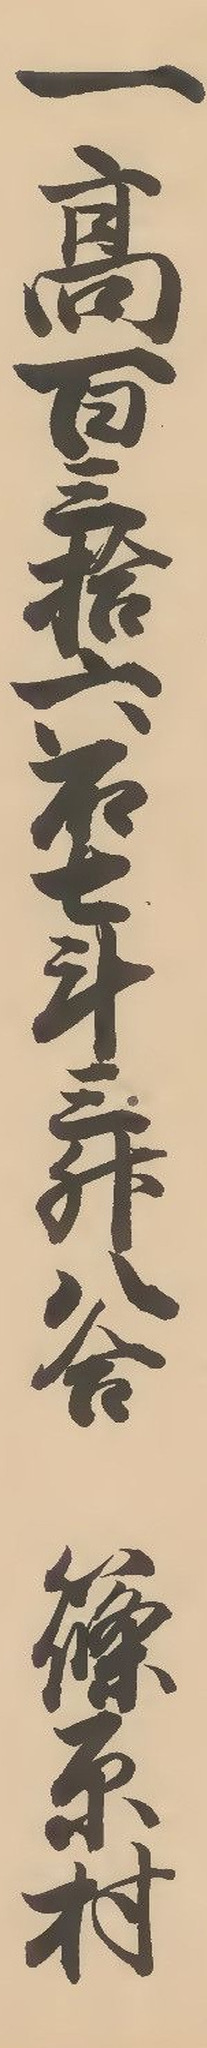一髙百三拾六石七斗三升八合篠原村
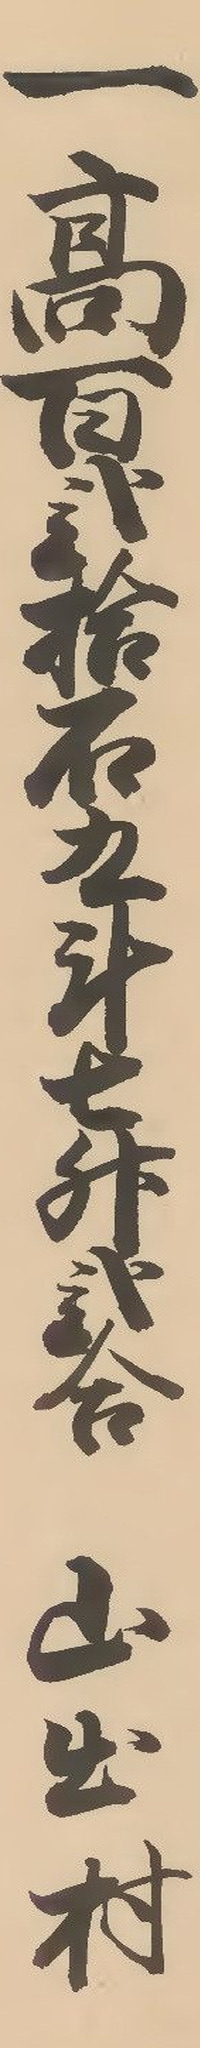一髙百弐拾石九斗七升弐合山出村
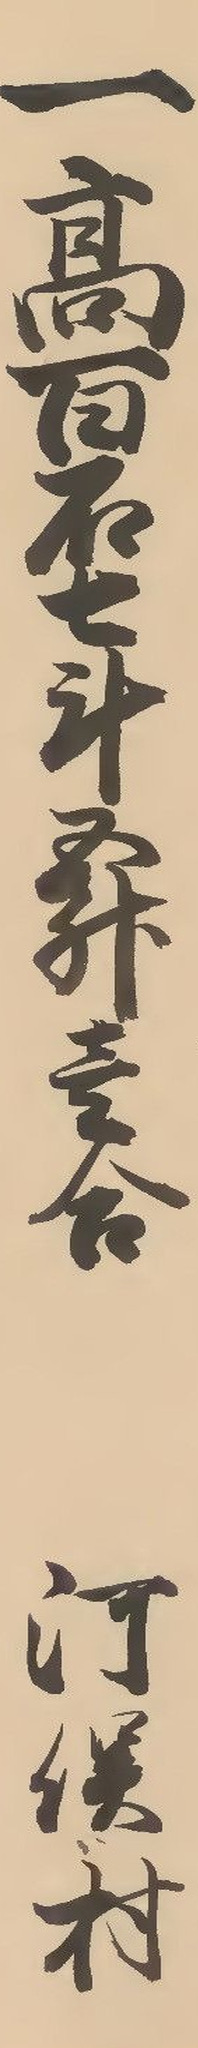一髙百石七斗五升壱合河俣村
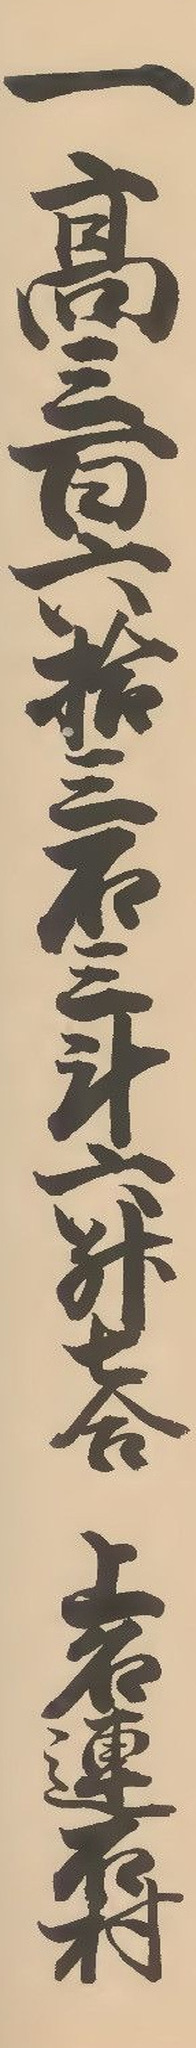一髙三百六拾三石三斗六升七合上名連石村
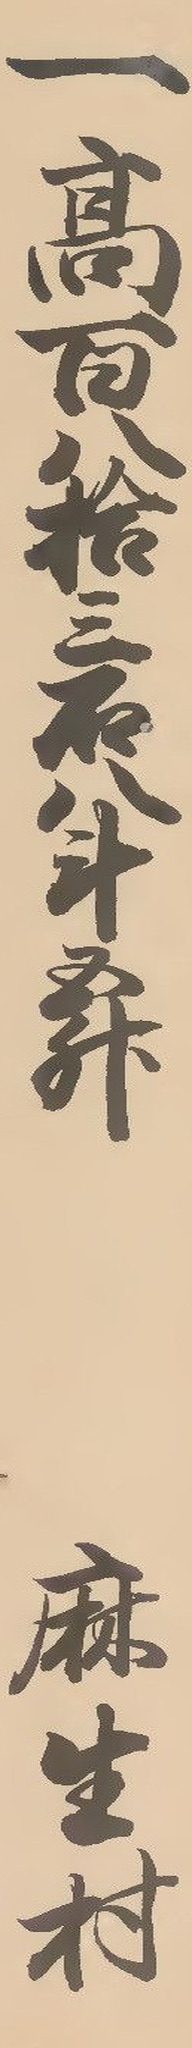一髙百八拾三石八斗五升麻生村
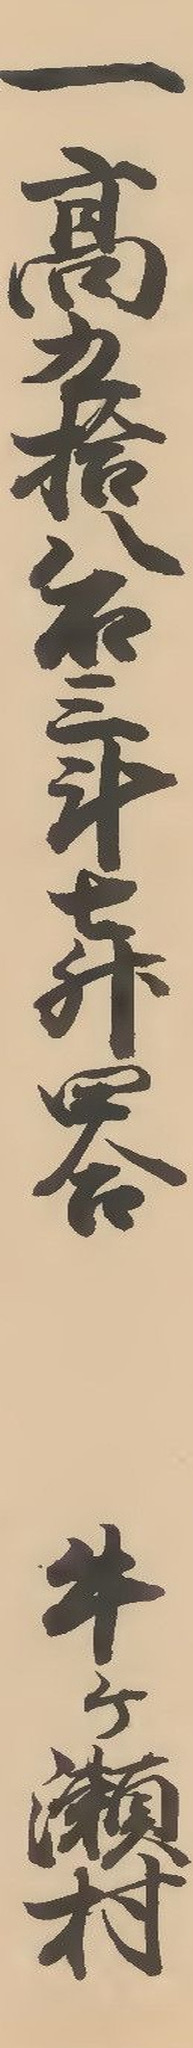一髙九拾八石三斗七升四合牛ケ瀬村
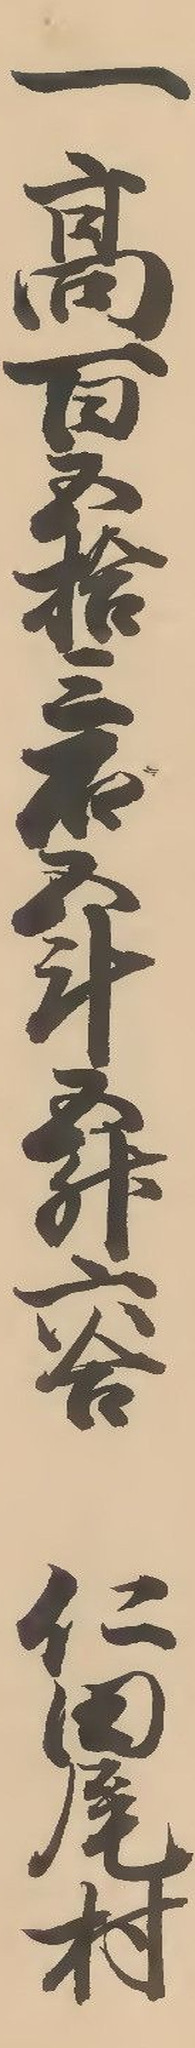一髙百五拾三石五斗五升六合仁田尾村
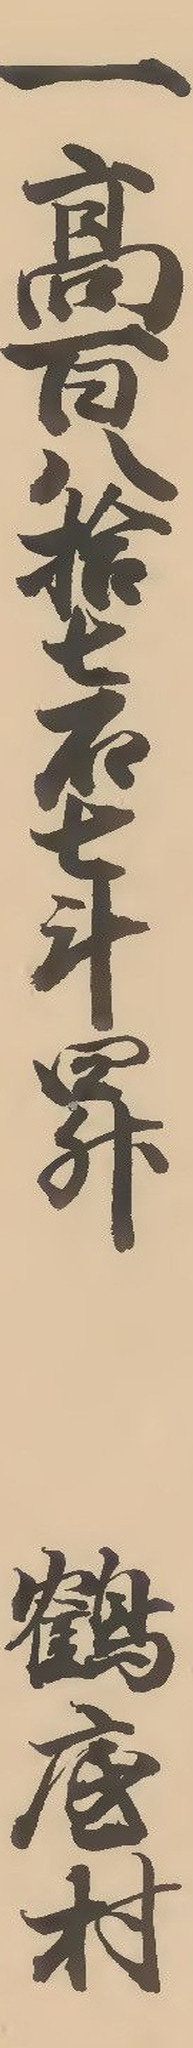一髙百八拾七石七升四合鶴底村

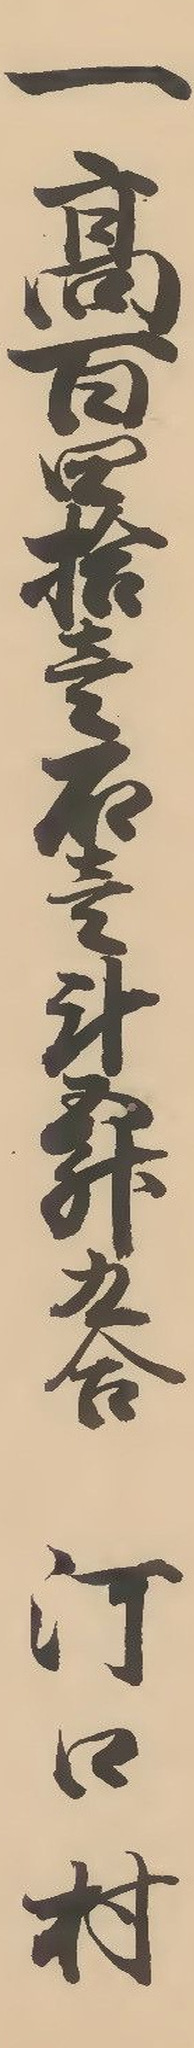一髙百四拾壱石壱斗五升九合河口村
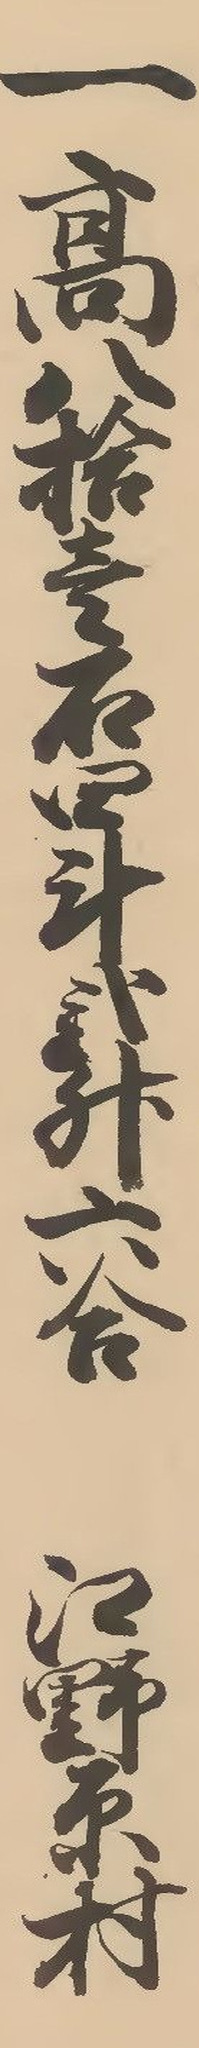一髙八拾壱石四斗四升六合江野原村
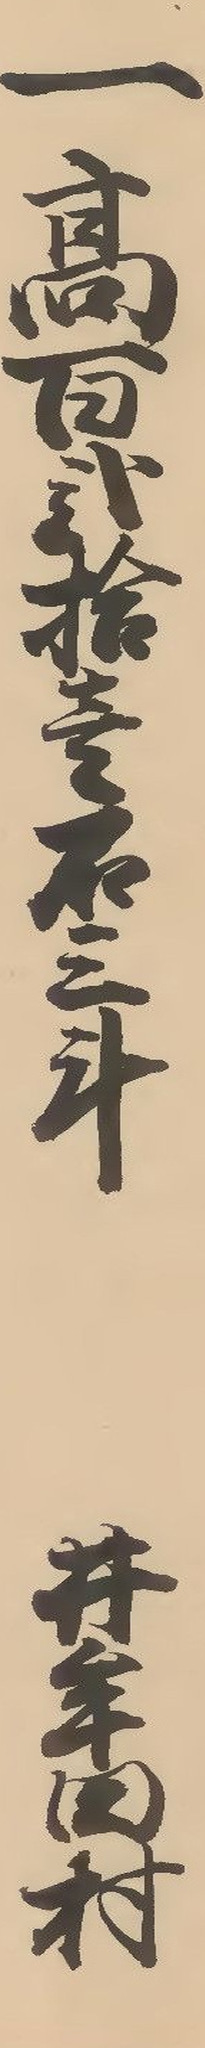一髙百弐拾壱石三斗井牟田村
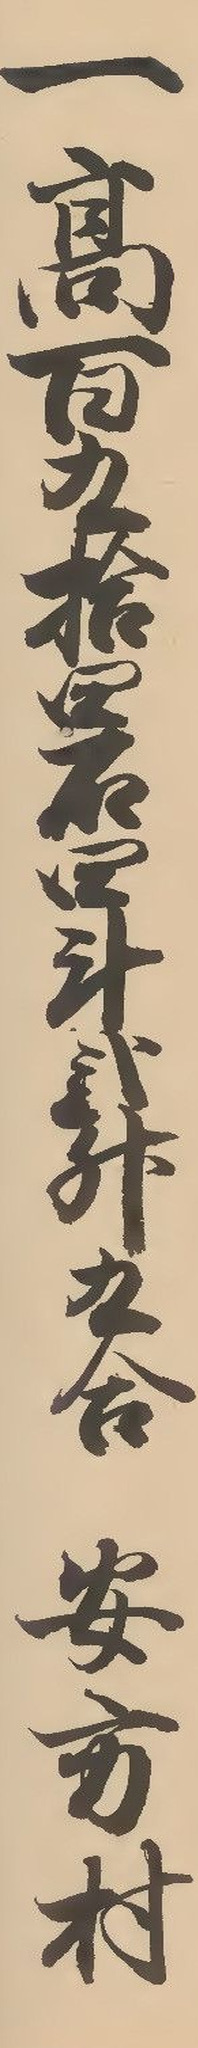一髙百九拾四石四斗弐升九合安方村
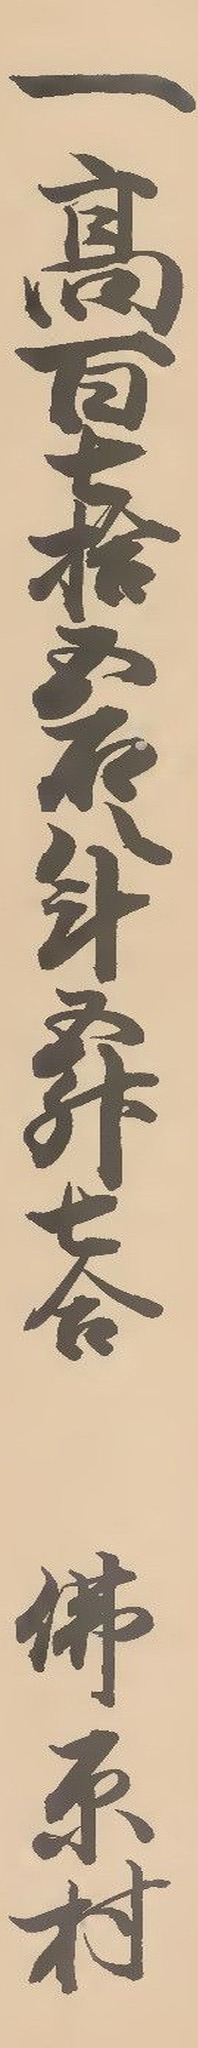一髙百七拾五石八斗五升七合佛原村
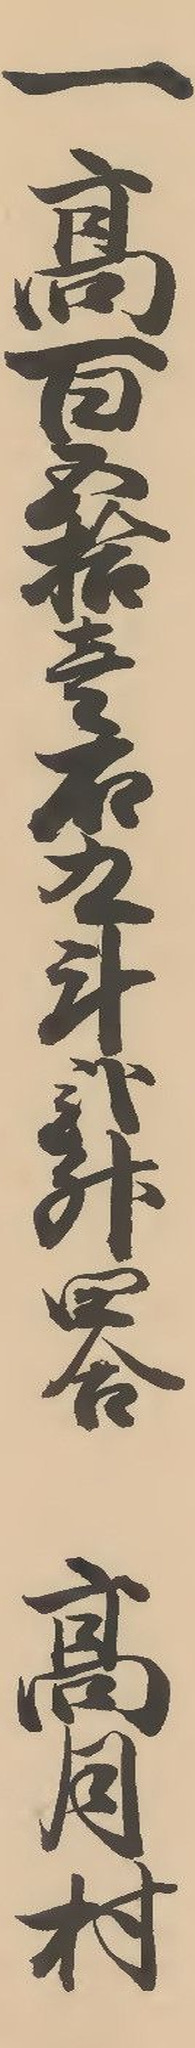一髙百五拾壱石九斗弐升四合髙月村
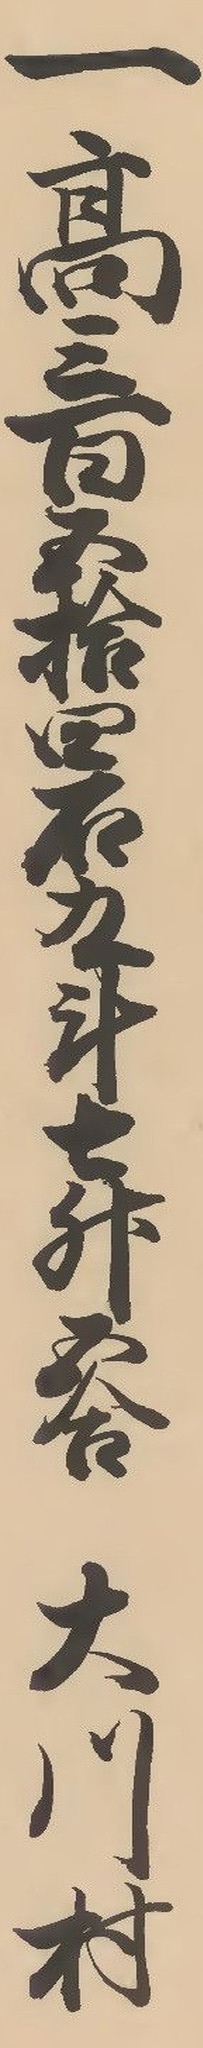一髙三百五拾四石九斗七升五合大川村
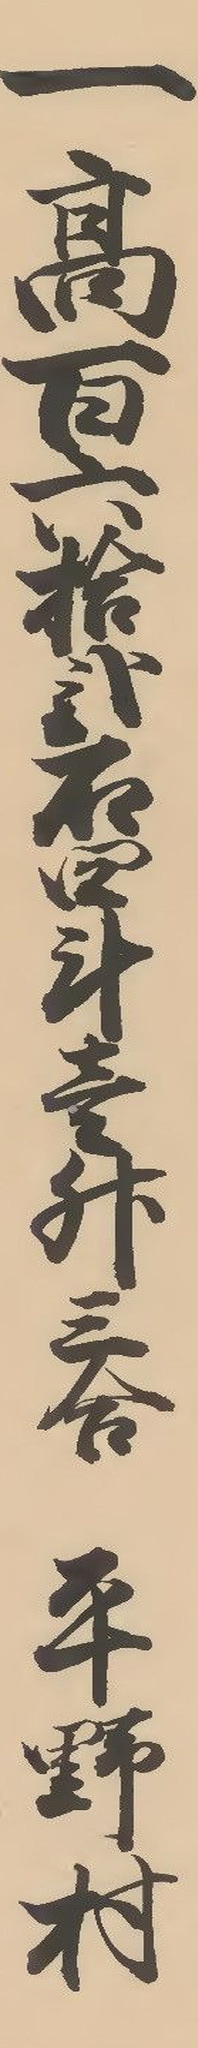一髙百六拾弐石四斗壱升三合平野村
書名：肥後国郷帳
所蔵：国立公文書館 National Archives of Japan
